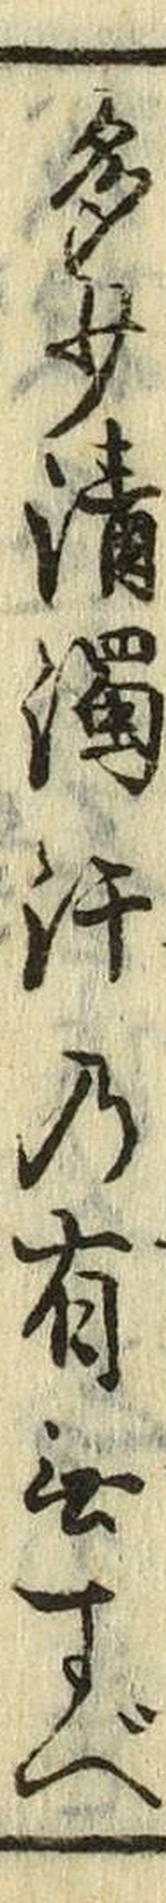多少清濁汗の有無すべ
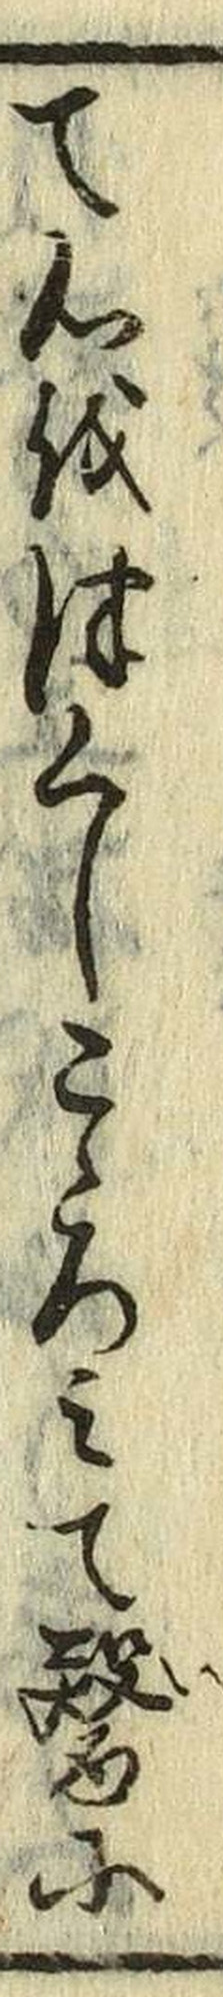て心をつくしこゝろみて医に
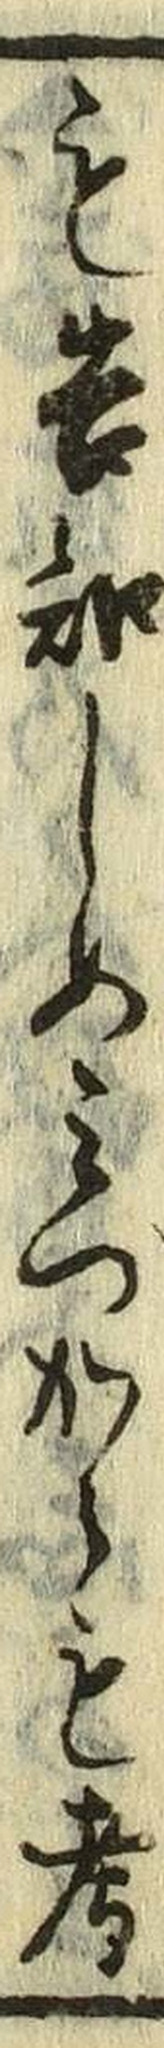も告知しめみづからも考
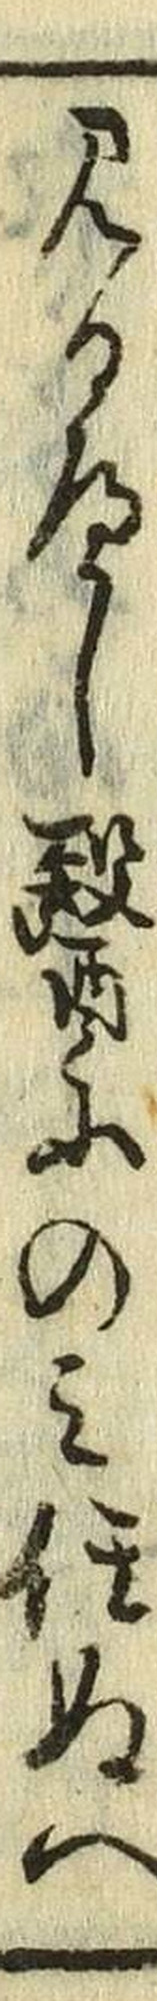見るべし医にのみ任ぬへ
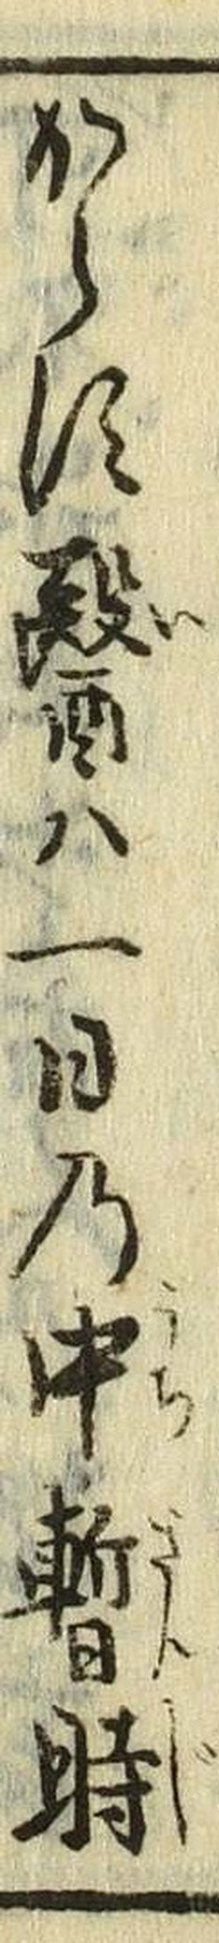からす医は一日の中暫時
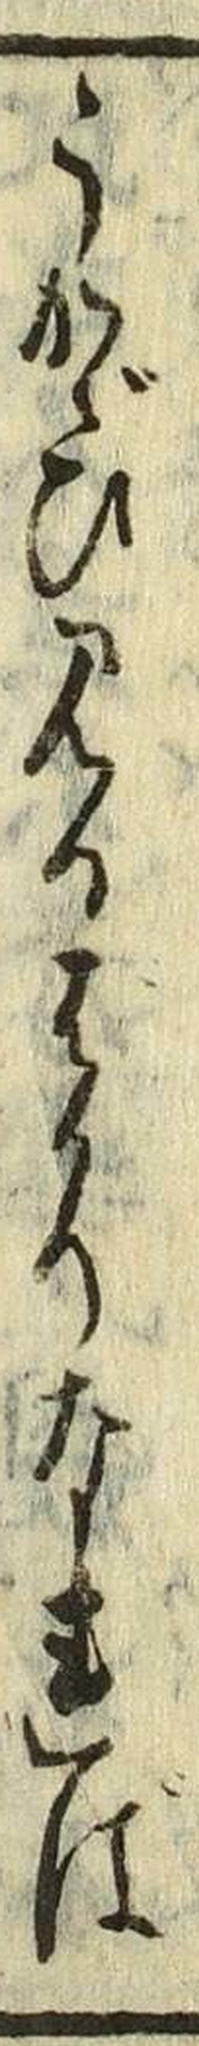うかゞひ見るはかりなれば
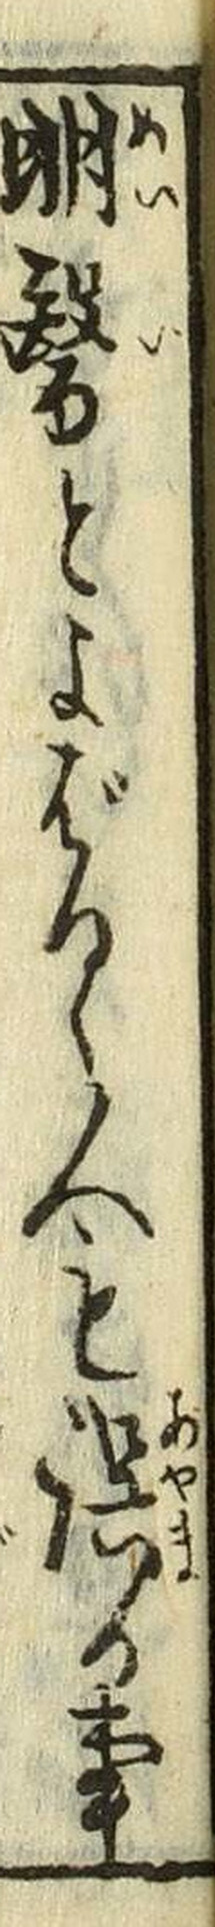明医とよばるゝ人も誤る事
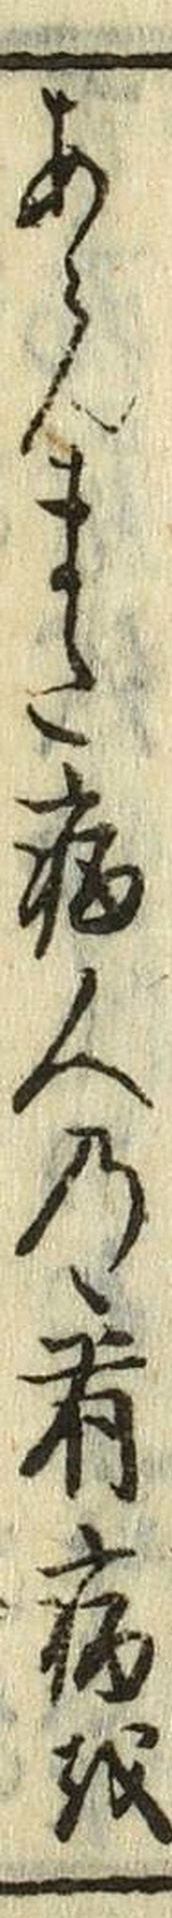あらんまた病人の看病を
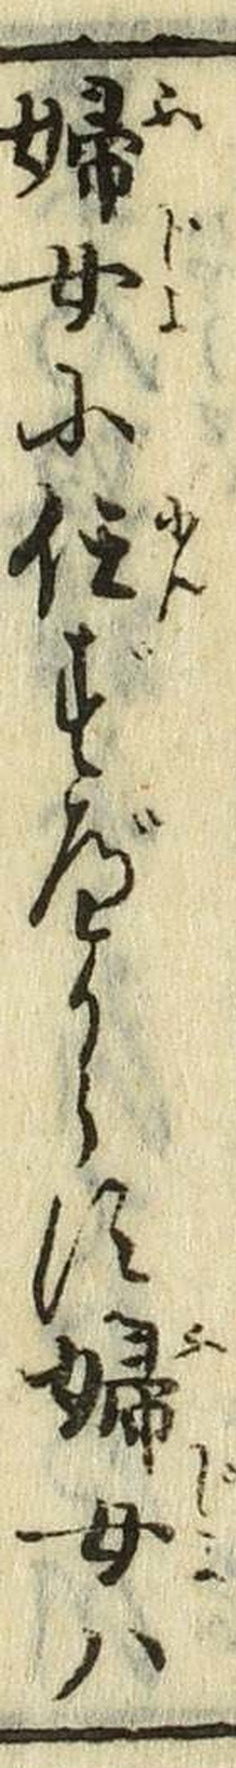婦女に任ずべからす婦女は
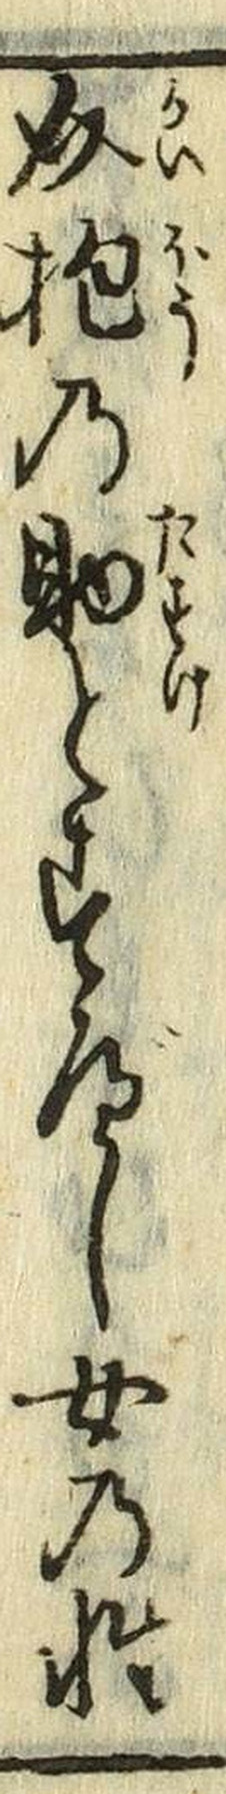介抱の助とすべし女の性
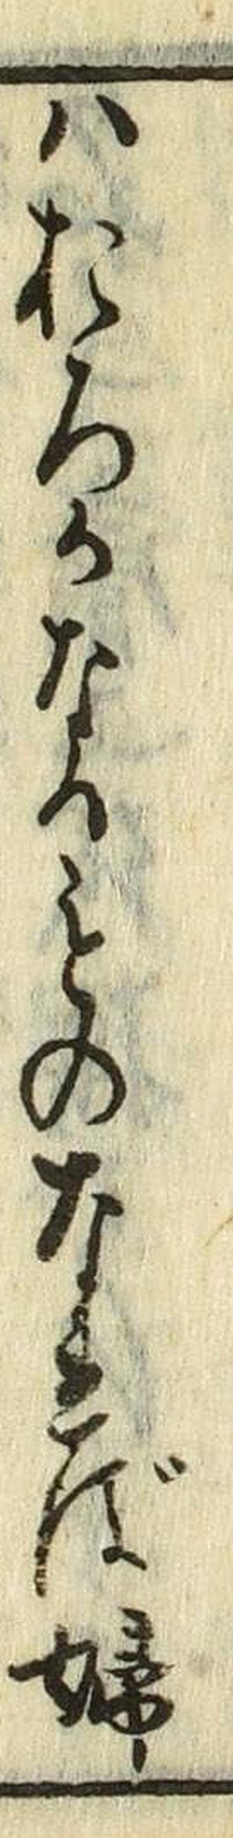はおろかなるものなれば婦
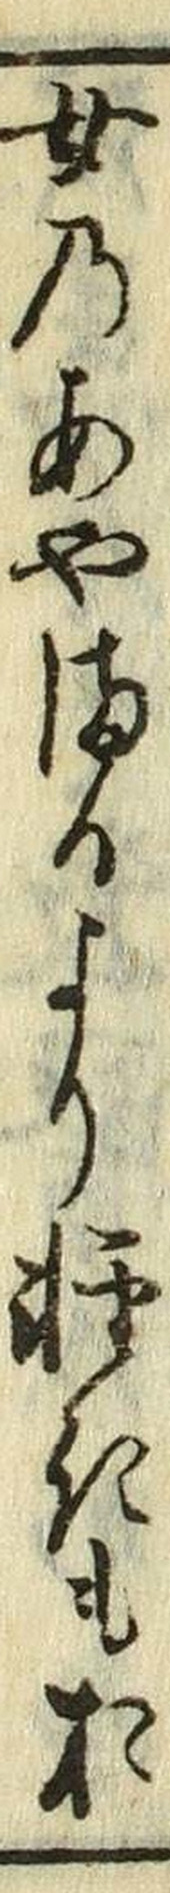女のあやまるより軽きもお
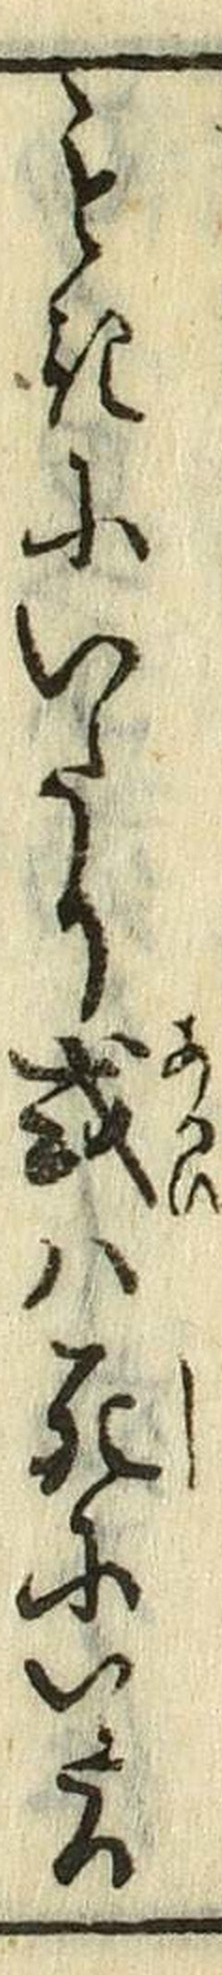もきにいたり或は死にいたる
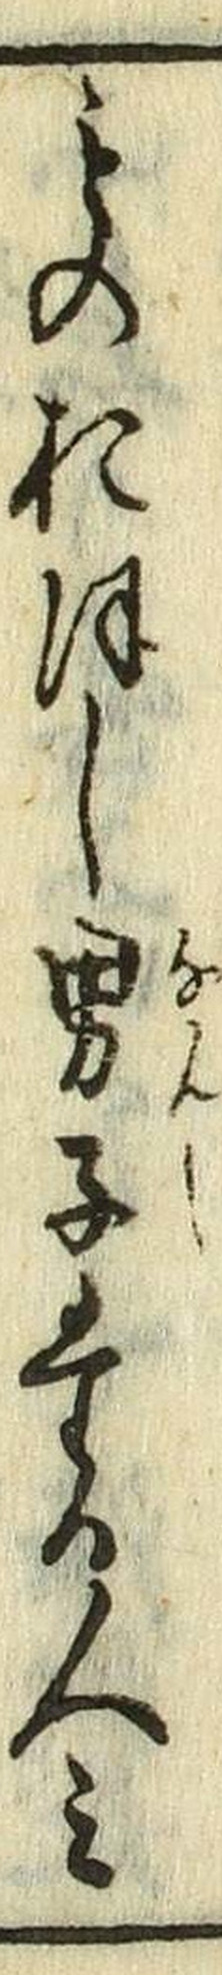ものおほし男子たる人み
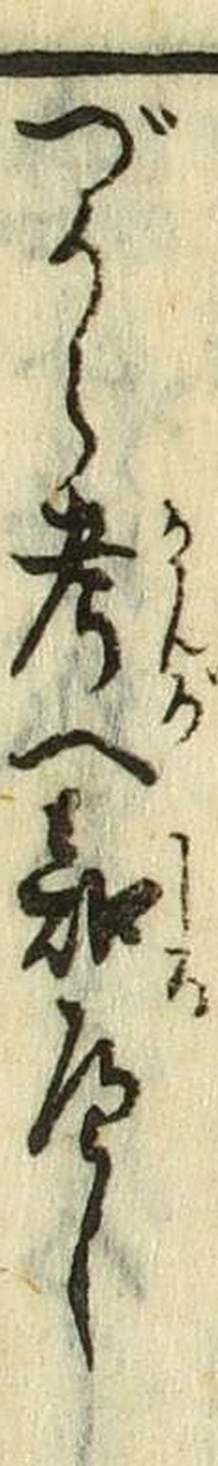づから考へ知へし
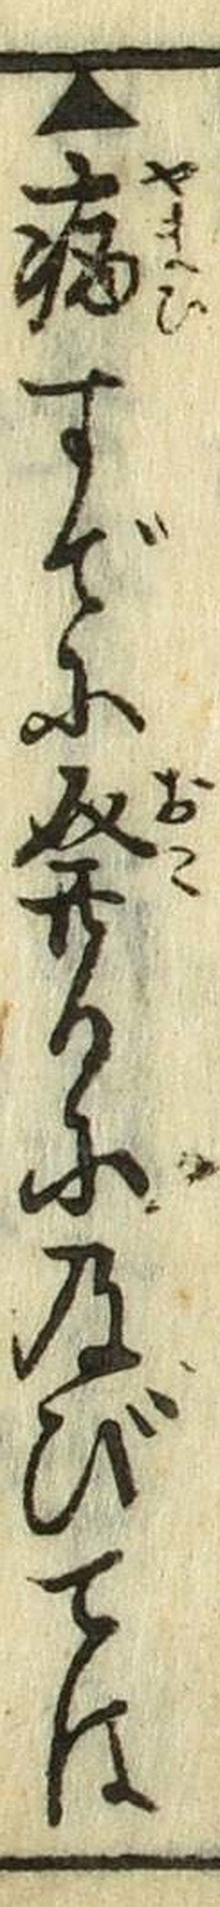▲病すでに発るに及びては
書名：居家養生記
